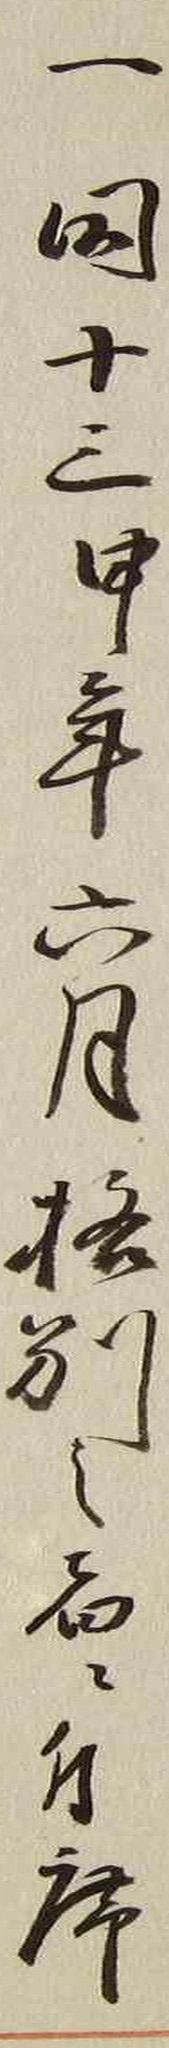一同十三申年六月格別之者ニ付席
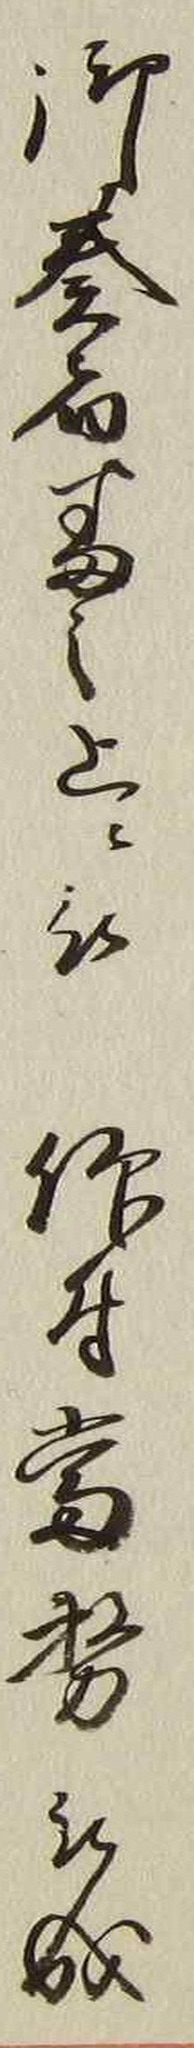御奏者番之上ニ被仰付当務被成
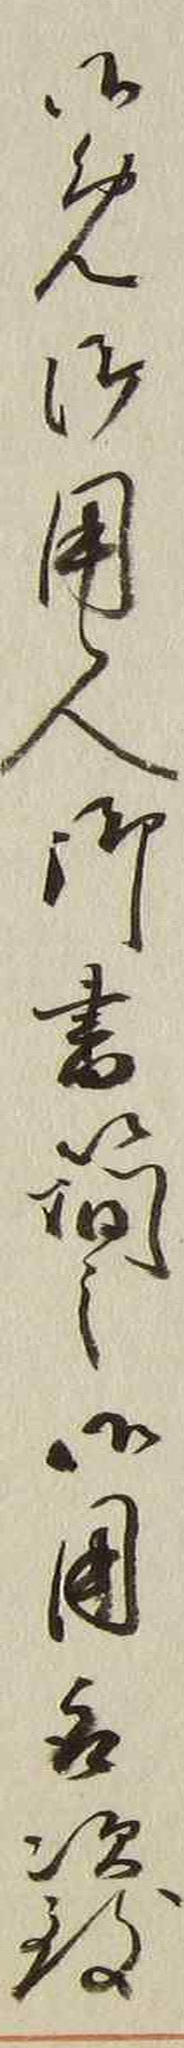御免御用人御書簡之御用取次致
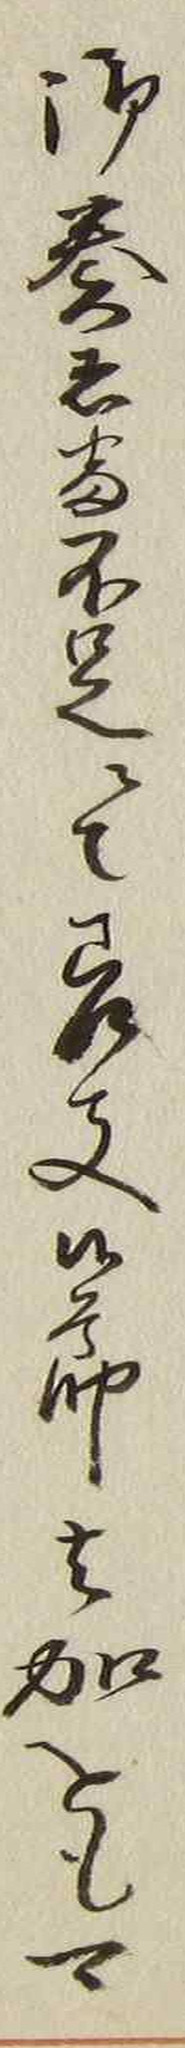御奏者番不足ニて差支節候者加をも可
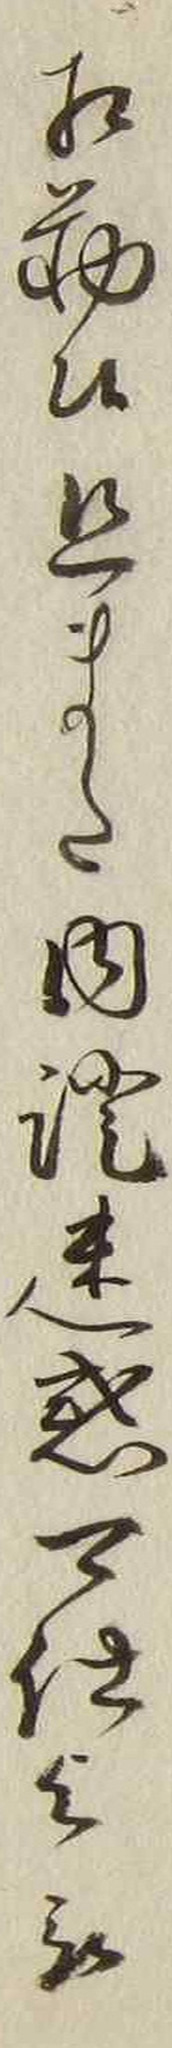相勤候且また内証迷惑可仕与被

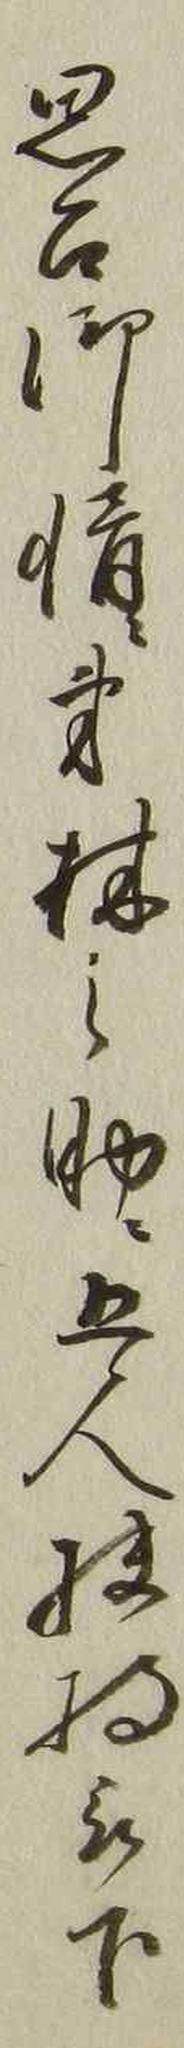思召御情ニ弟林之助ニ五人扶持被下
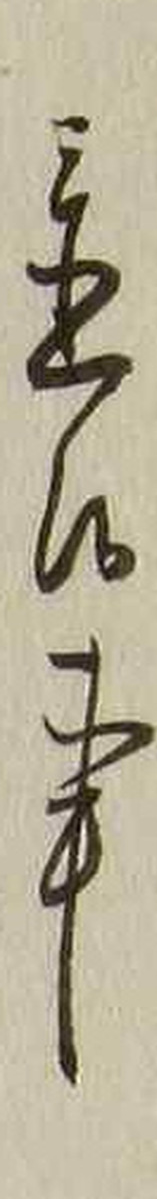置候事
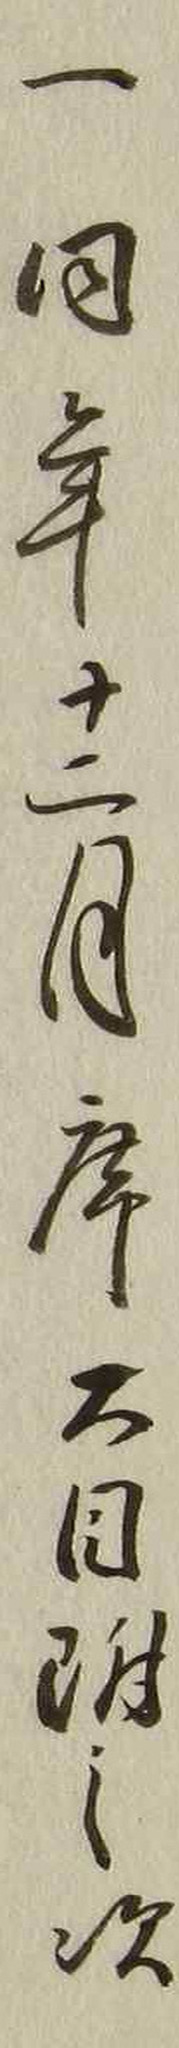一同年十二月席大目附之次
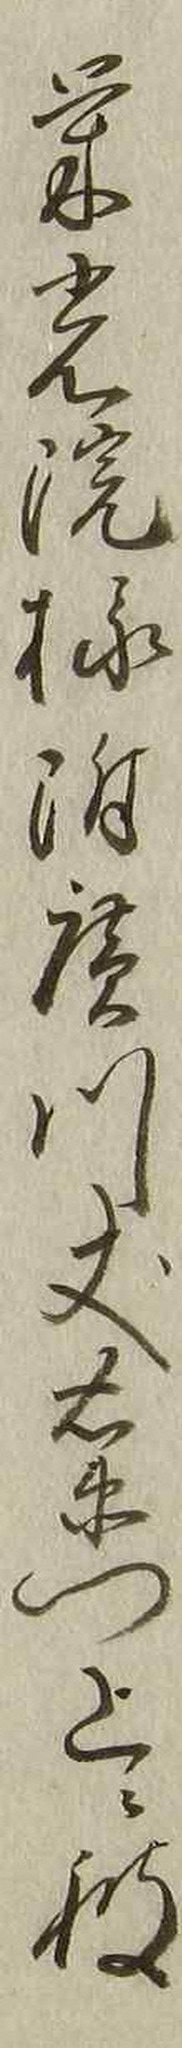栄光院様附広川丈茶門上ニ被
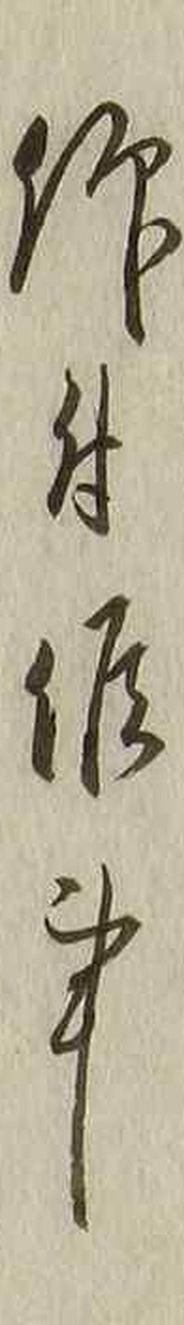仰付候事
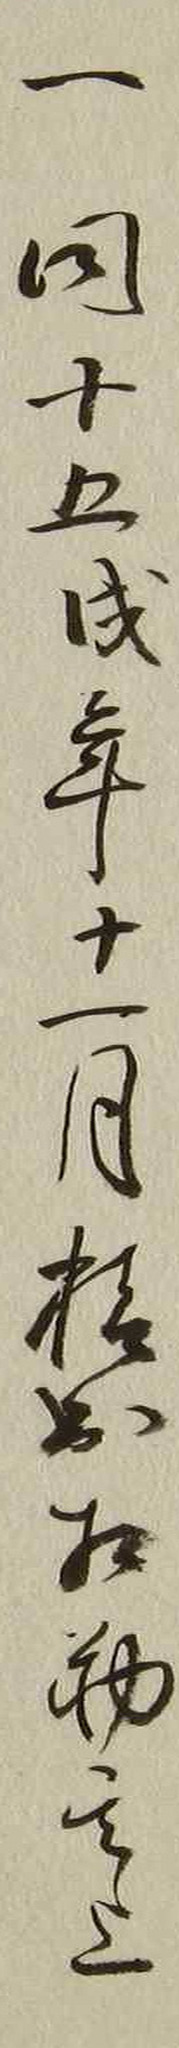一同十五戌年十一月精出相勤其上
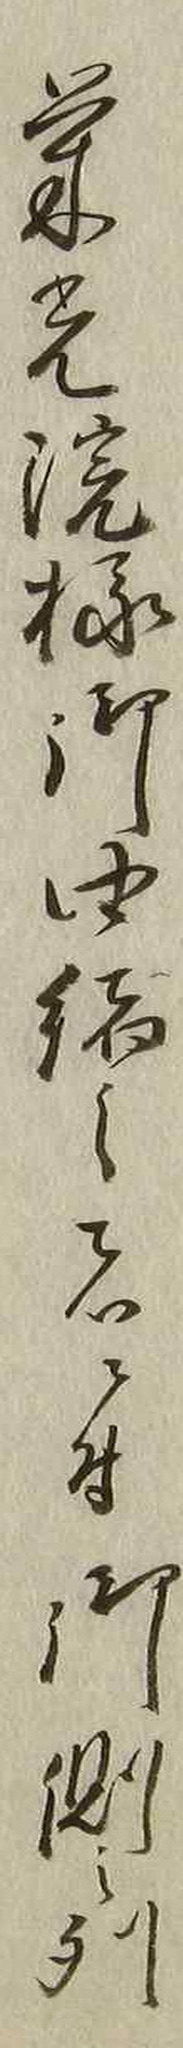栄先院様御由縮之者ニ付御側之列
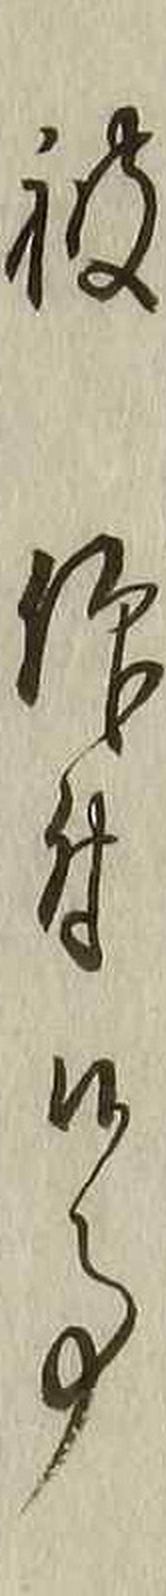被仰付候事
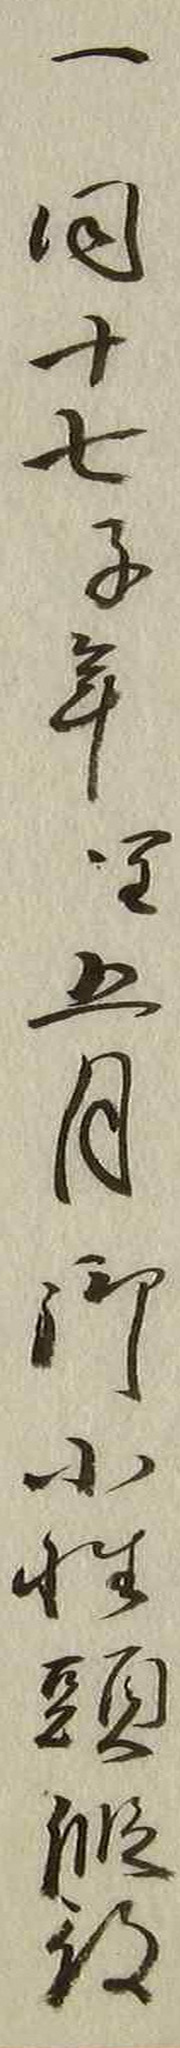一同十七子年閏五月御小性頭仮役
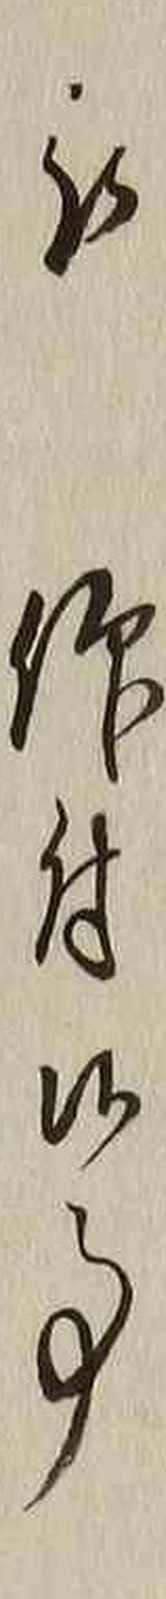被仰付候事
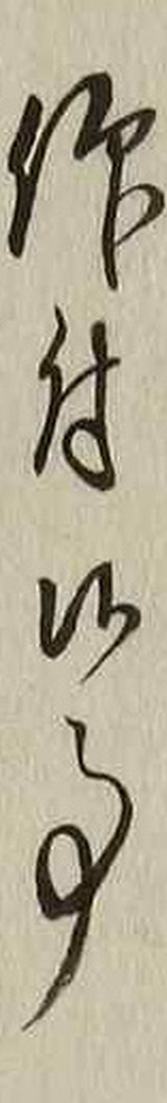仰付候事
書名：諸士系譜　巻之122　よ之部5
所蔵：会津若松市立会津図書館
